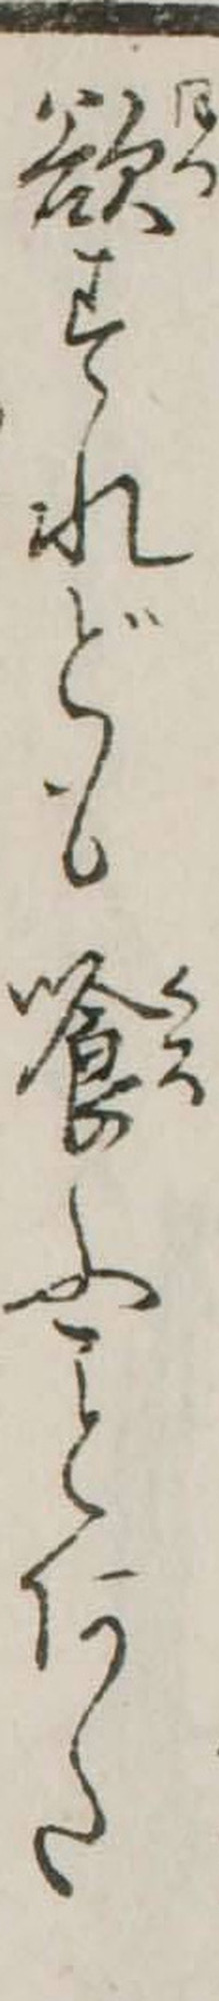欲すれども喰ふことあた
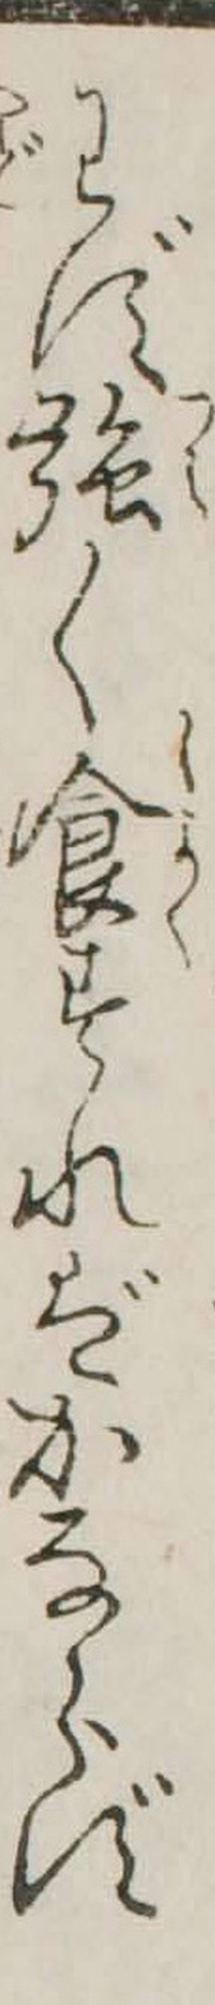わず強く食すればかならず
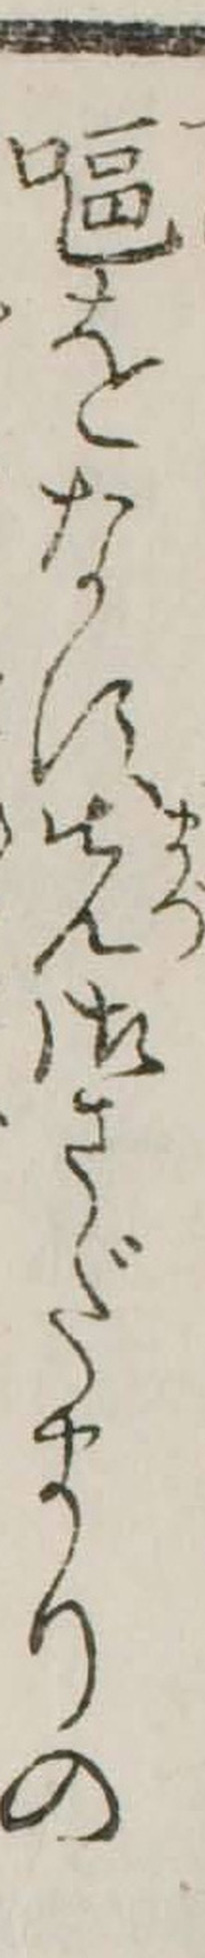嘔をなす先おさだまりの
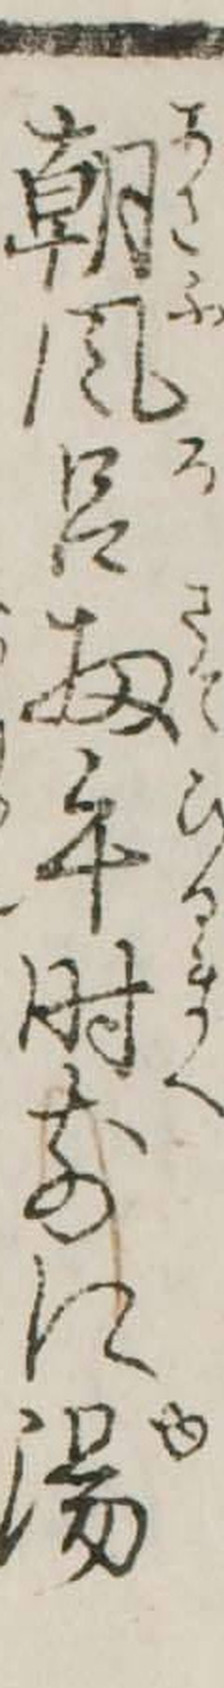朝風呂扨午時前に湯
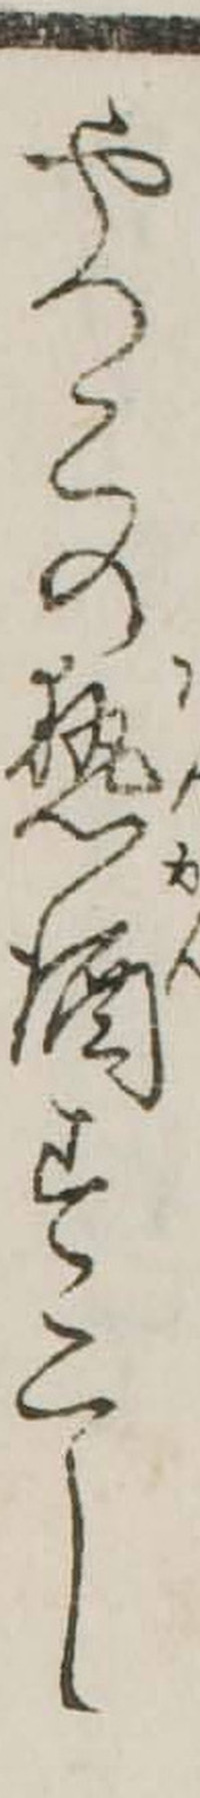やつこの熱酒すこし
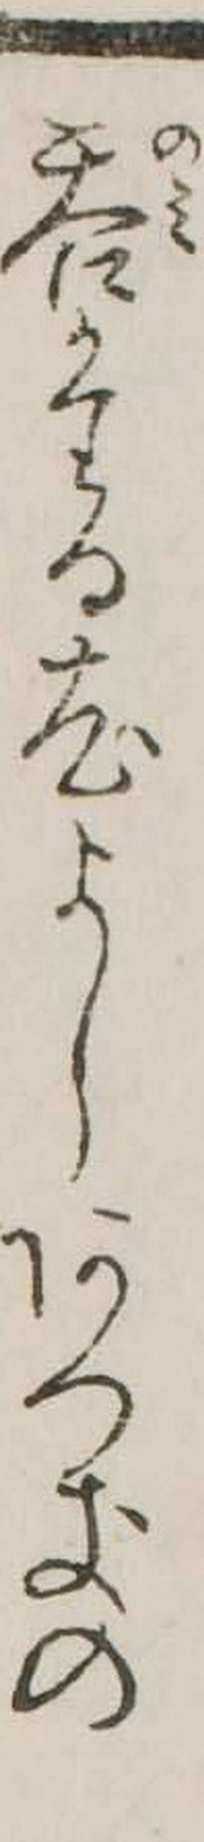呑たる尤よしあつきの
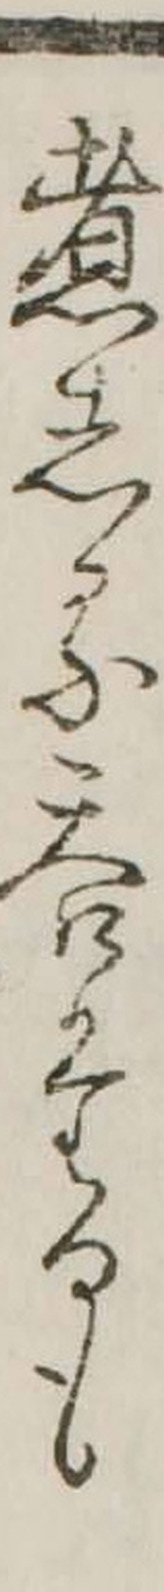煮しる呑たるも
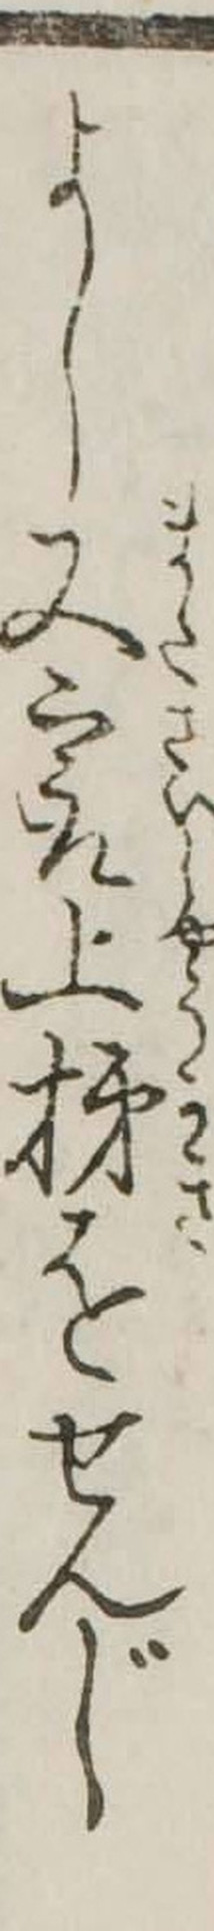よし又最上柿をせんじ
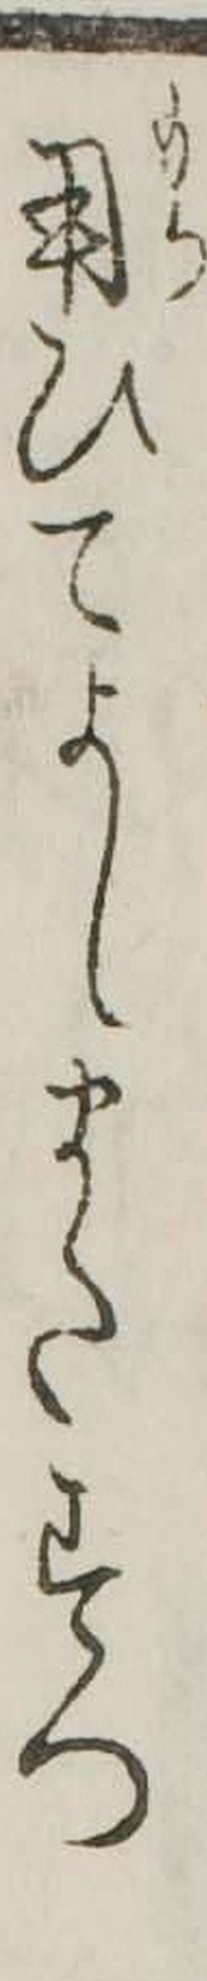用ひてよしまたすつ
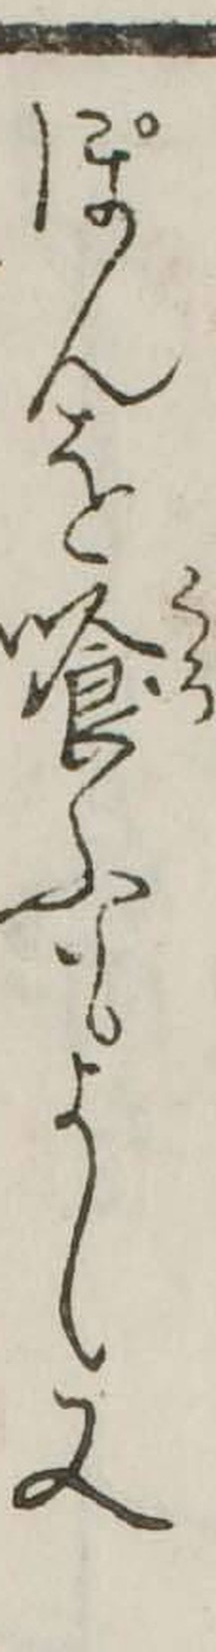ぽんを喰ふもよし又
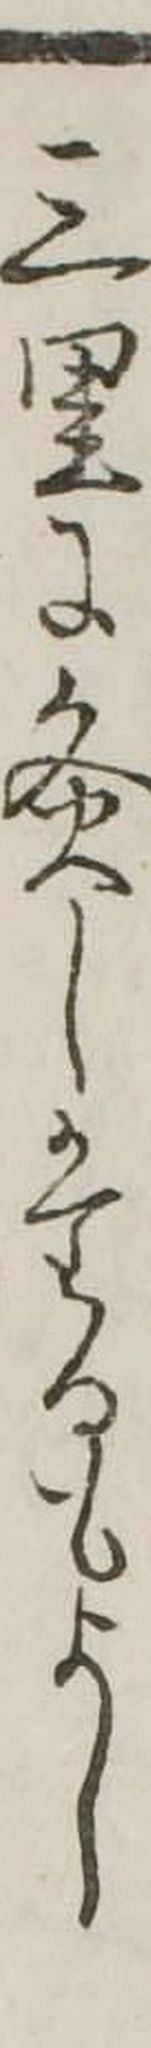三里に灸したるもよし
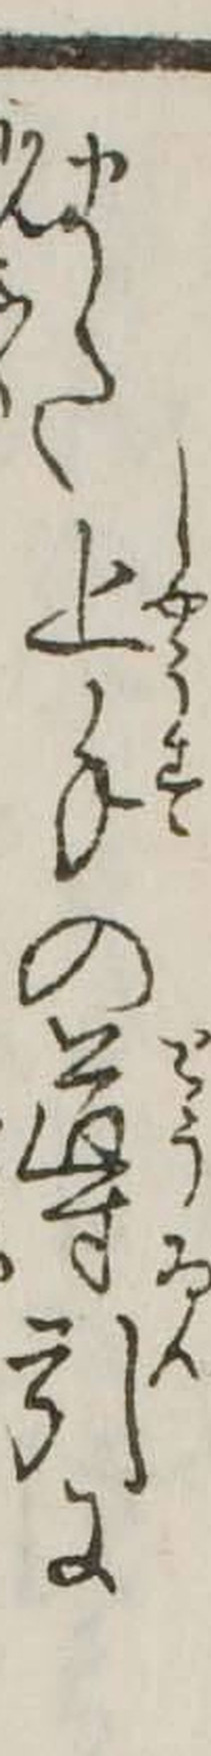また上手の導引に
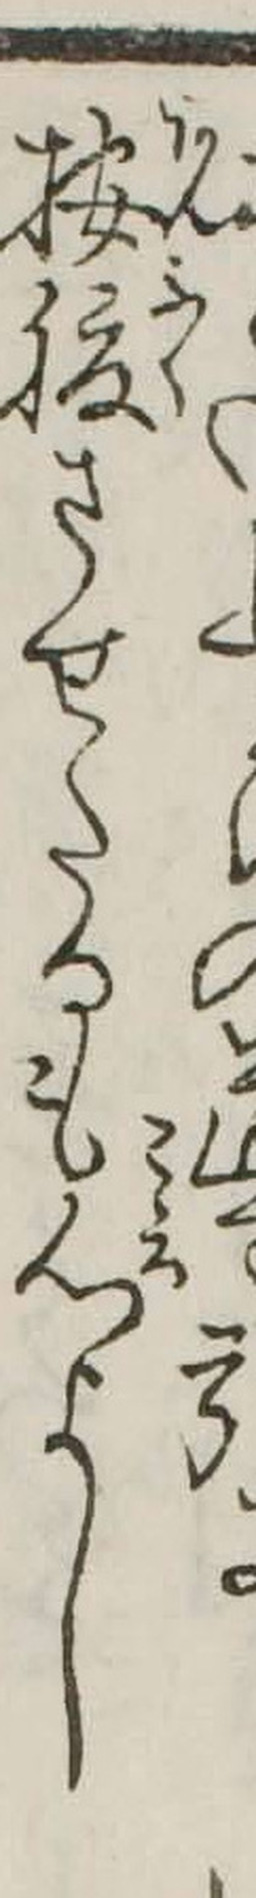按腹させたるも心よし
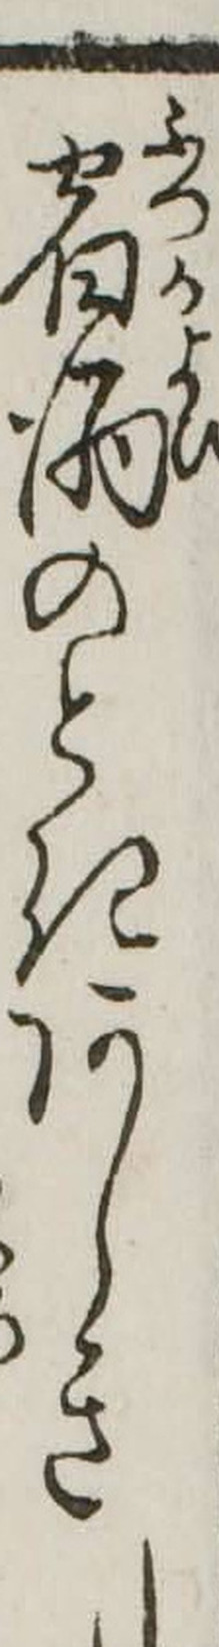宿酒のときあしき
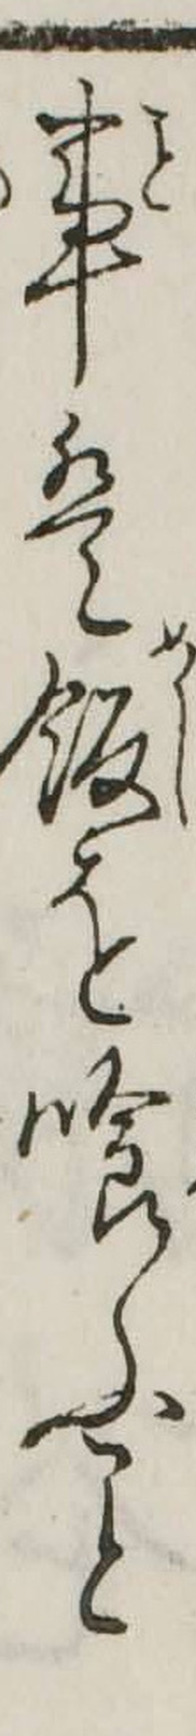事は飯を喰ふこと
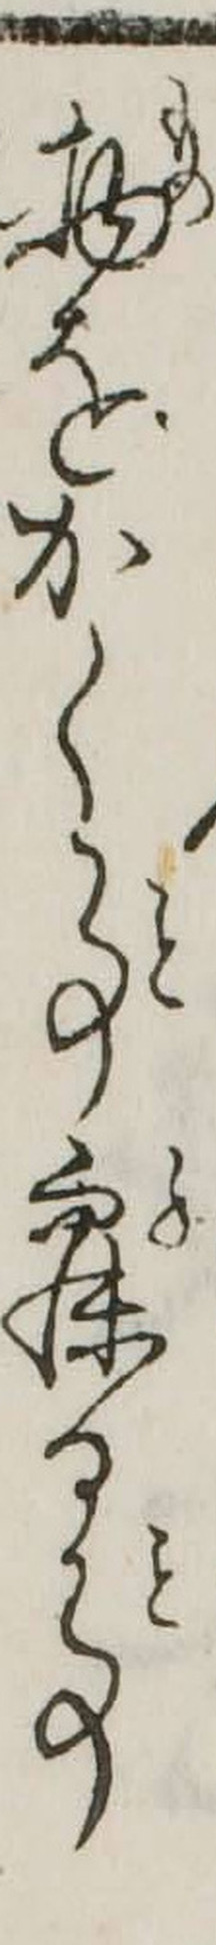物をかく事寝る事
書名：繪本不盡泉
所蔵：国文学研究資料館
